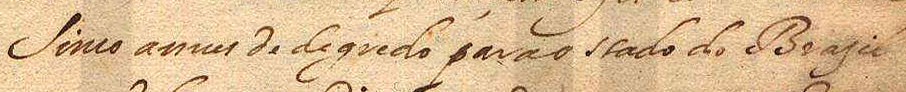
Sinco annos de degredo para o stado do Brazil
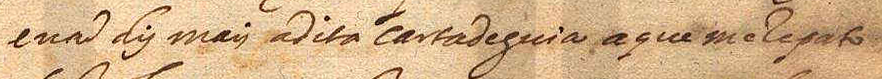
e naõ dis mais a dita carta de guia a que me Reporto
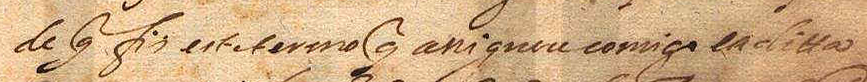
de q̄ fis este termo q̄ assignou comigo e a ditta
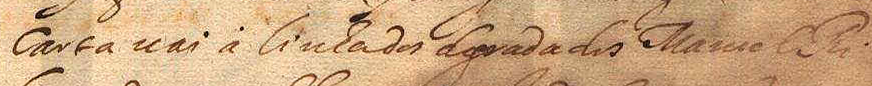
carta uai a linha dos degradados Manoel Ri
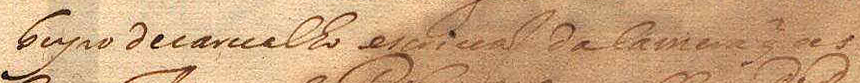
beyro de carualho escriuaꝭ da Camera q̄ es
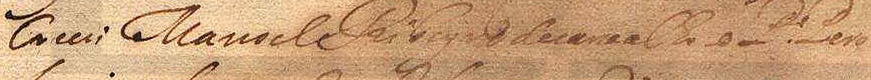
Creui Manoel Ribeyro de carualho o P.e Pero
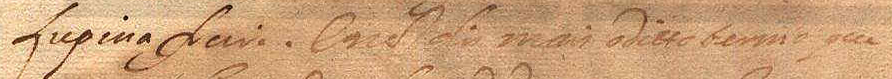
Lupina freire. E nā dis mais o ditto termo que
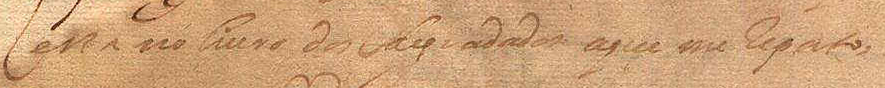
esta no liuro dos degradados a que me Reporto,
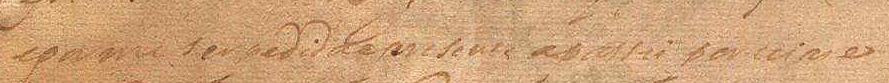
e por me ser pedida a presente a passei por uia e
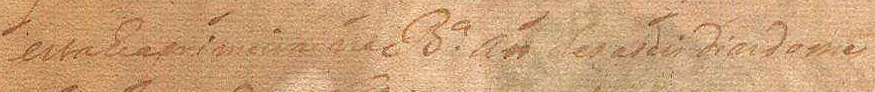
esta he a primeira na Ba. aos desaseis dias do mes
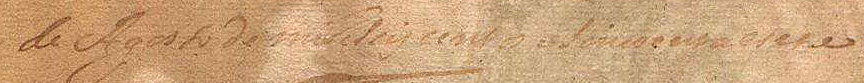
de Agosto de mil e seiscentos e sincoenta e sete
